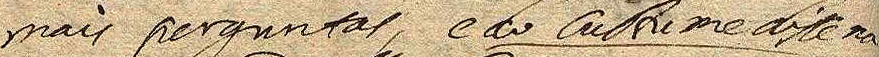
mais perguntas, e do custume disse na
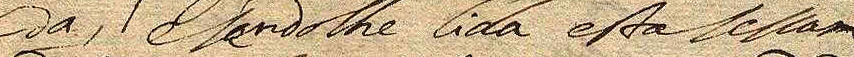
da, e sendo lhe lida esta sessam
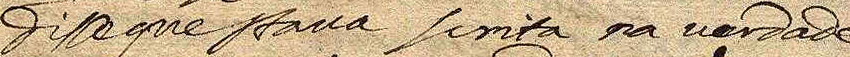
disse que staua scrita na verdade
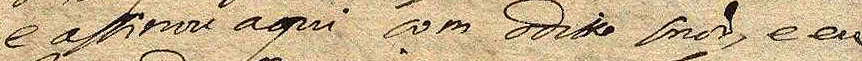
e assinou aqui com o ditto Snor̄, e eu
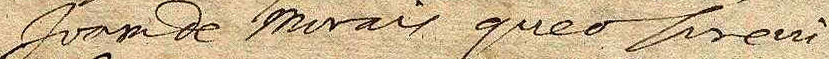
Joam de Morais que o screvi
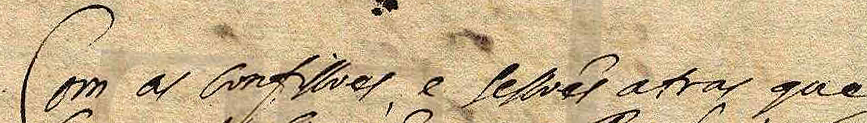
Com as confissoes, e sessoes̄ atras que
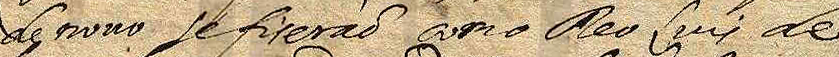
de nouo se fiseraõ com o Reo Luis de
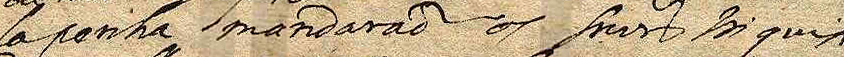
la penha mandaraõ os Snors̄ Jnquisi
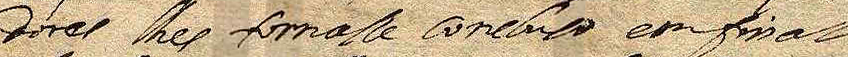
dores lhes tornasse concluso em final
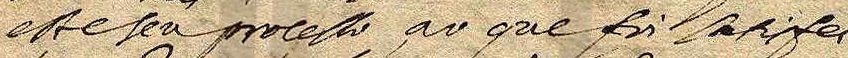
este seu proçesso ao que foi satisfei
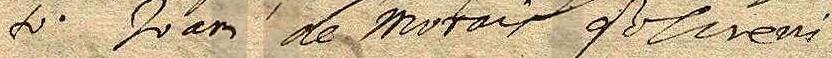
to. Joam de Morais que o escrevi
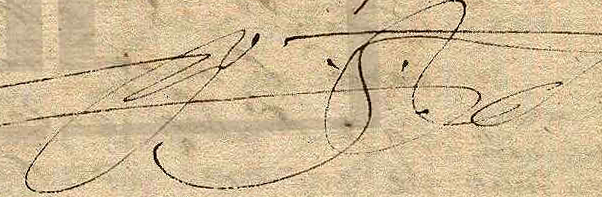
Jo M.
